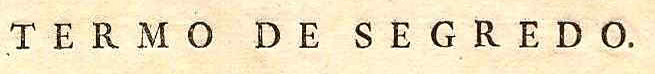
TERMO DE SEGREDO
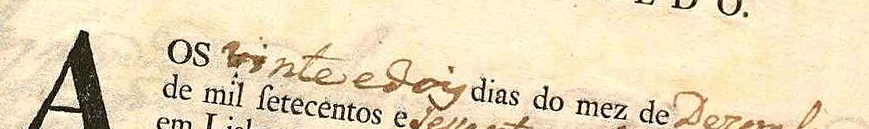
A OS vinte e dois dias do mez de Dezembro
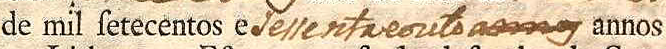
de mil setecentos e settenta e outo annos annos
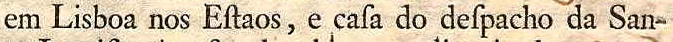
em Lisboa nos Estaos, e casa do despacho da San
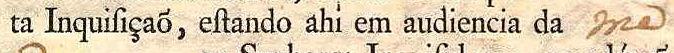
ta Inquisiçaõ, estando ahi em audiencia da, Me
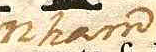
nham
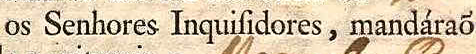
os Senhores Inquisidores, mandáraõ
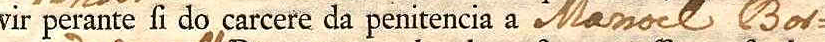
vir perante si do carcere da penitencia a Manoel Bor
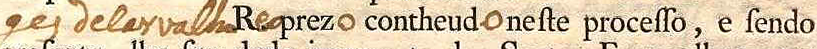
ges de Carvalho Reo prezo contheudo neste processo, e sendo
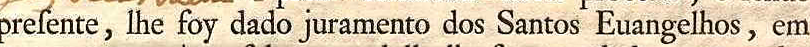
presente, lhe foy dado, juramento dos Santos Euangelhos, em
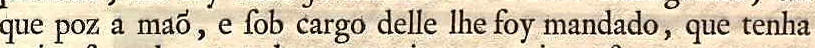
que poz a maõ, e sob cargo delle lhe foy mandado, que tenha
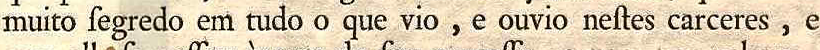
muito segredo em tudo o que vio, e ouvio nestes carceres, e
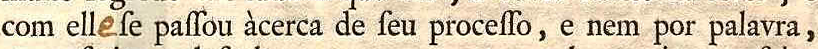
com elle se passou acerca de seu processo, e nem por palavra,
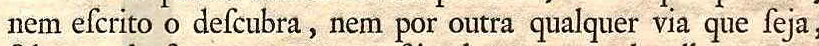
nem escrito o descubra, nem por outra qualquer via que seja,
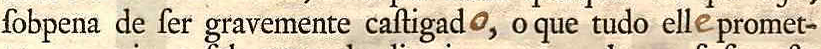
sob pena de ser gravemente castigado, o que tudo elle promet
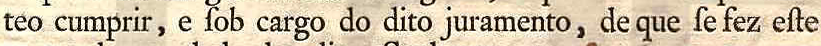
teo cumprir, e sob cargo do dito juramento, de que se fez este
